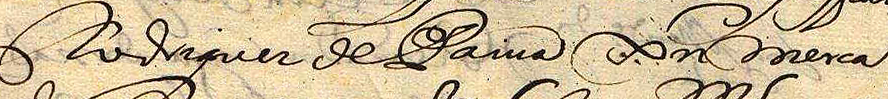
Rodriguez de Paiua xn merca
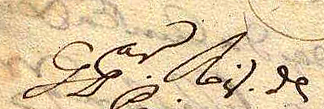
Gpar. Rois̄. de
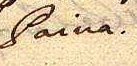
Paiua.
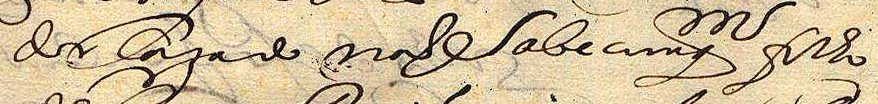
dor cazado naõ Sabe com qm filho
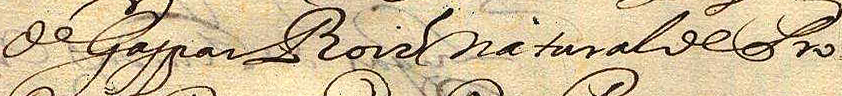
de Gaspar Roiz̄ natural de Pro
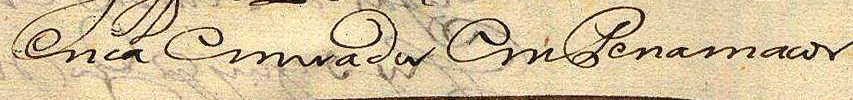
ença e morador Em Penamacor
